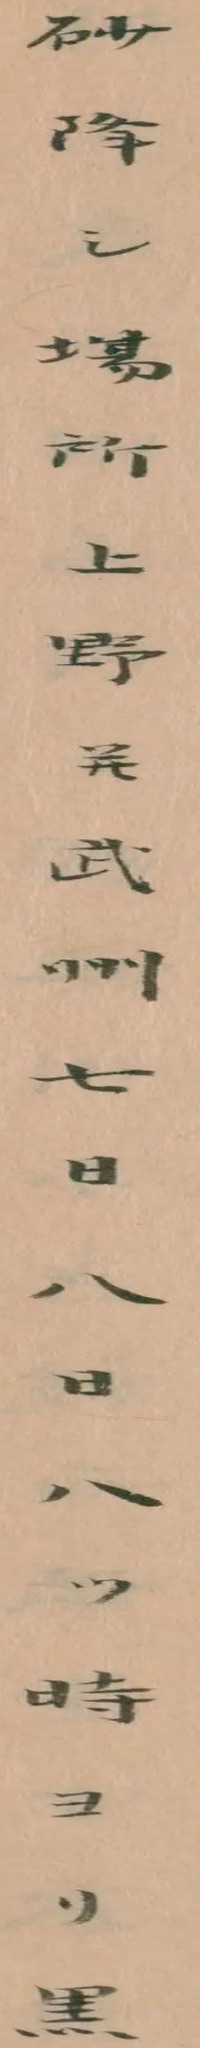砂降シ場所上野并武州七日八日八ッ時ヨリ黒
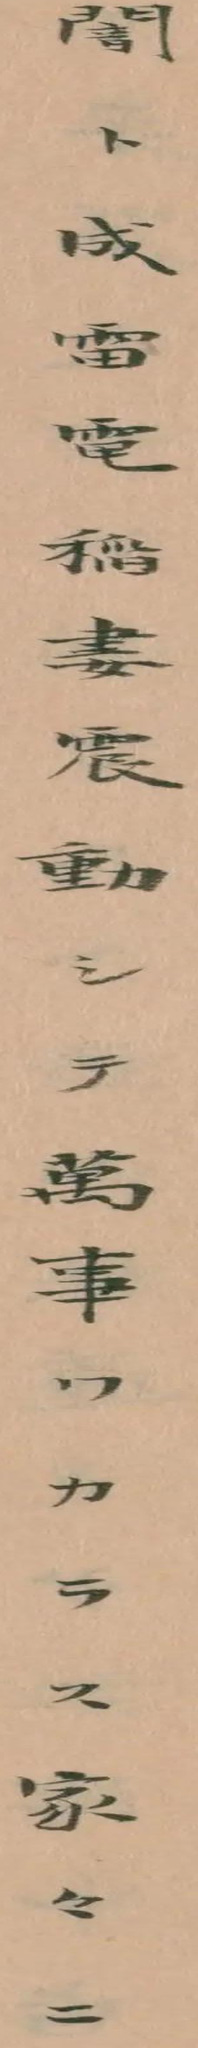闇ト成雷電稲妻震動シテ万事ワカラス家々二
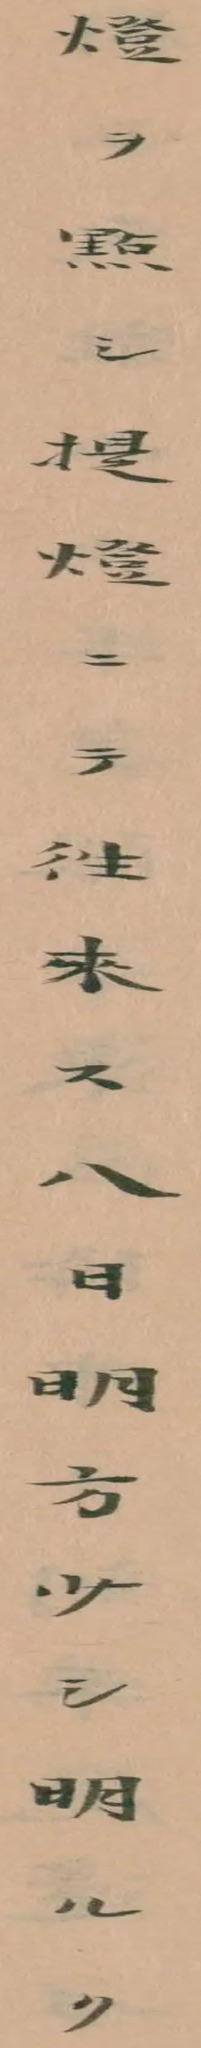燈ヲ点シ提燈ニテ往来ス八日明方少シ明ルク
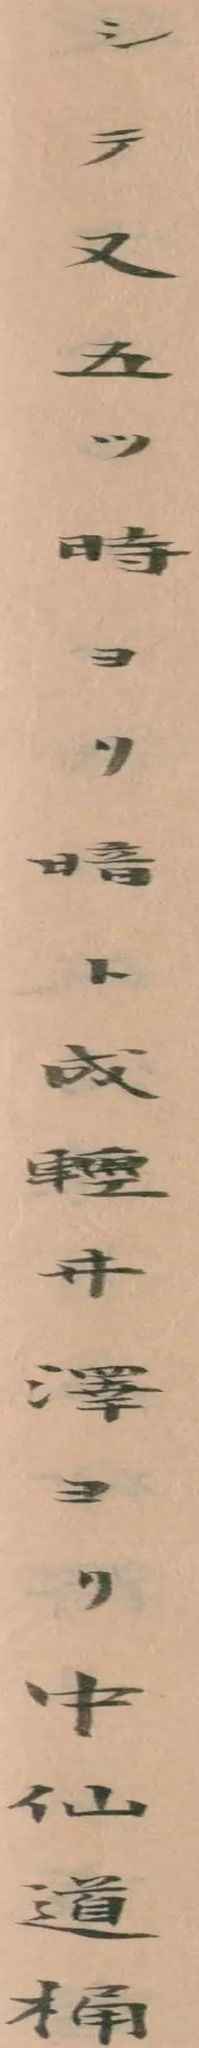シテ又五ッ時ヨリ暗ト成軽井沢ヨリ中山道桶
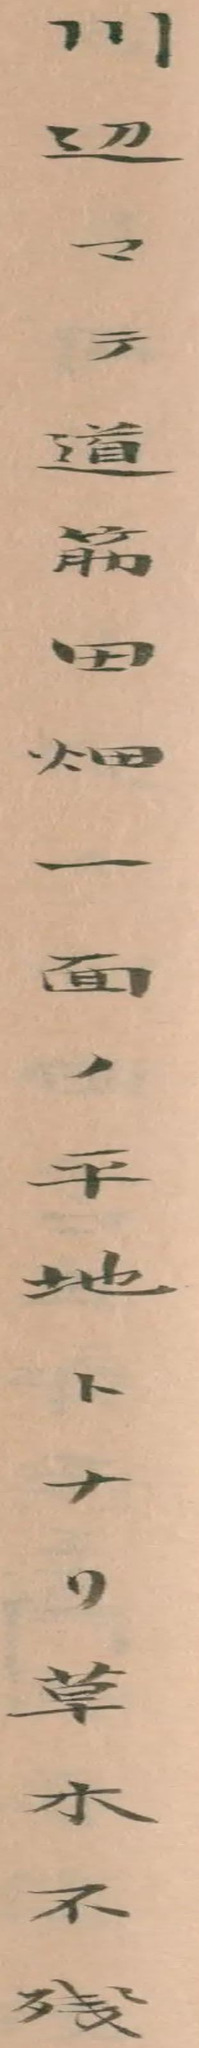川辺マデ道筋田畑一面ノ平地トナリ草木不残
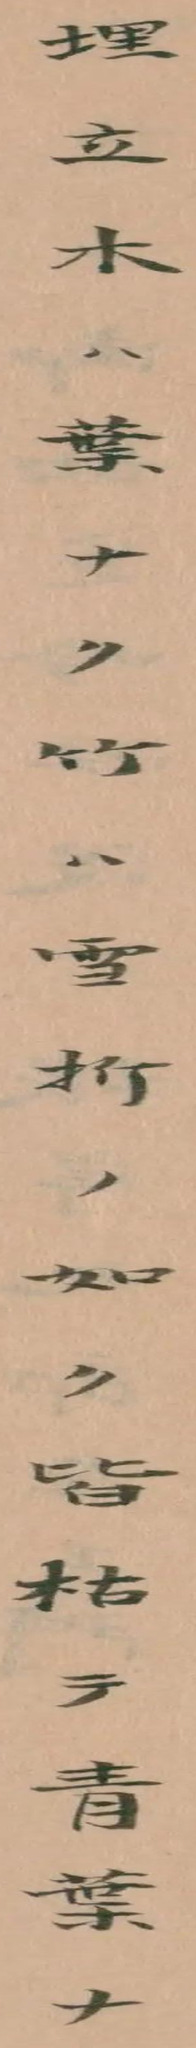埋立木ハ葉ナク竹ハ雪折ノ如ク皆枯テ青葉ナ
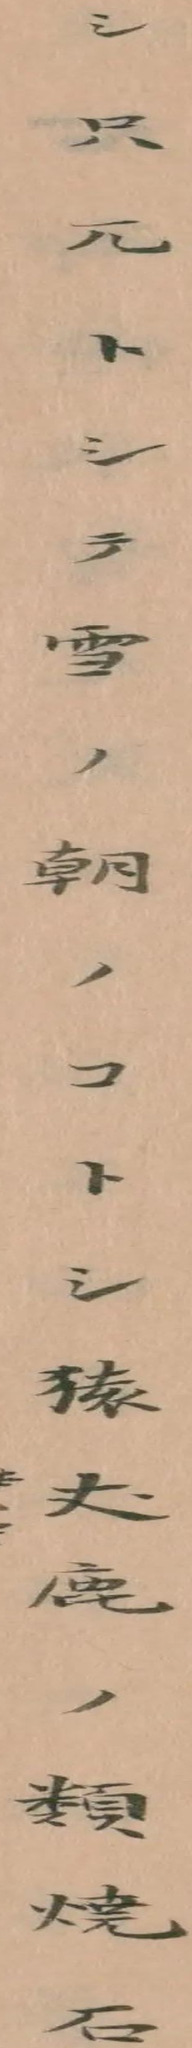シ只兀トシテ雪ノ朝ノコトシ猿丈鹿ノ類焼石
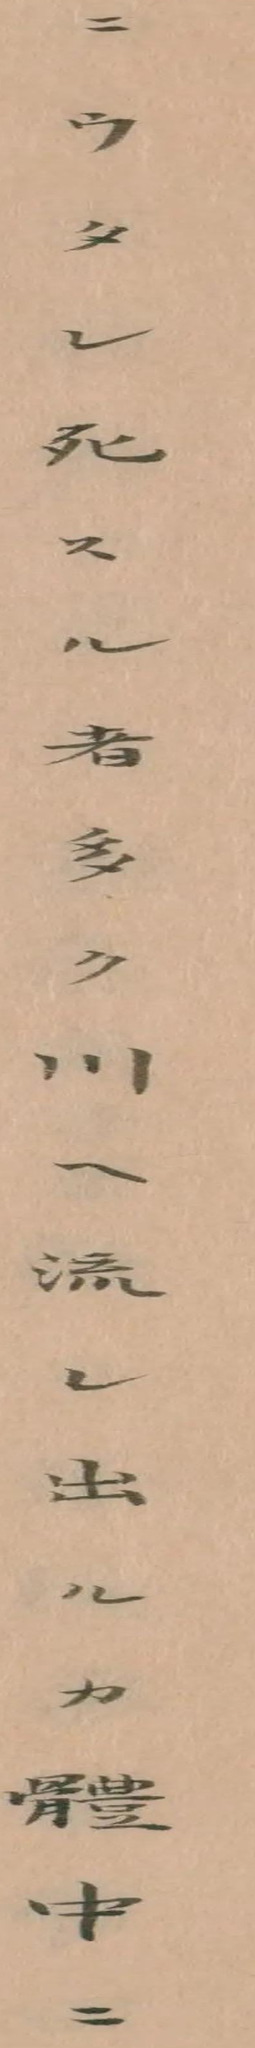二ウタレ死スル者多ク川へ流レ出ルカ体中二
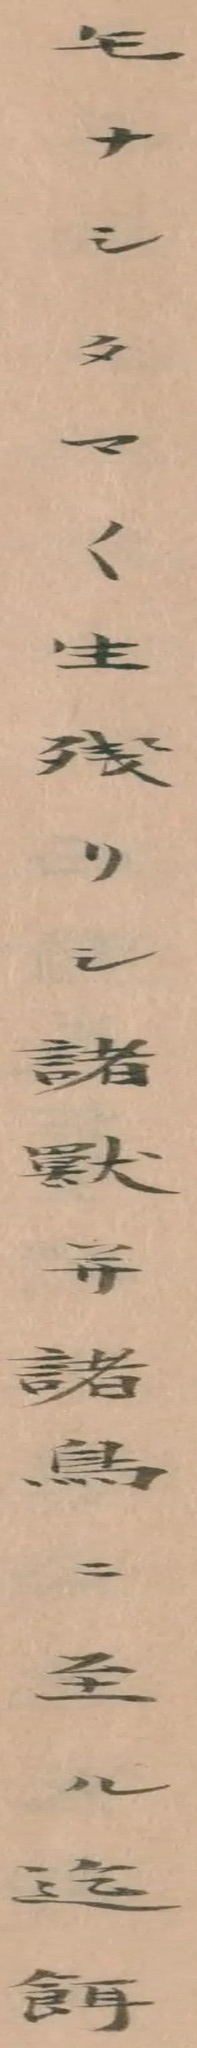毛ナシタマ〳〵生残リシ諸獣并諸鳥二至ル迄餌
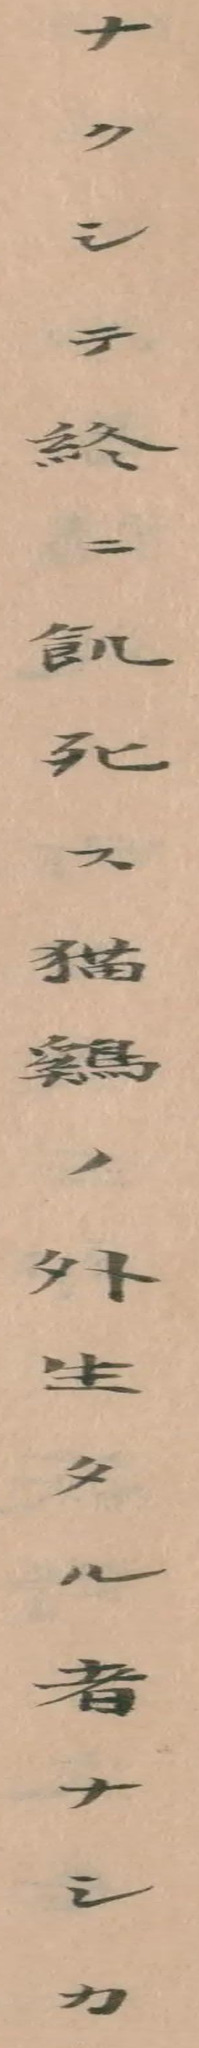ナクシテ終二飢死ス猫鶏ノ外生タル者ナシカ
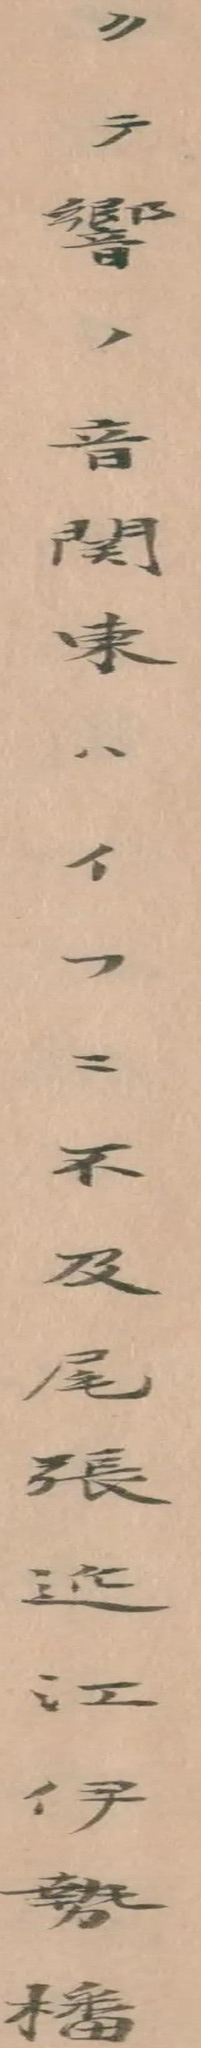クテ響ノ音関東ハイフ二不及尾張迄江伊勢播
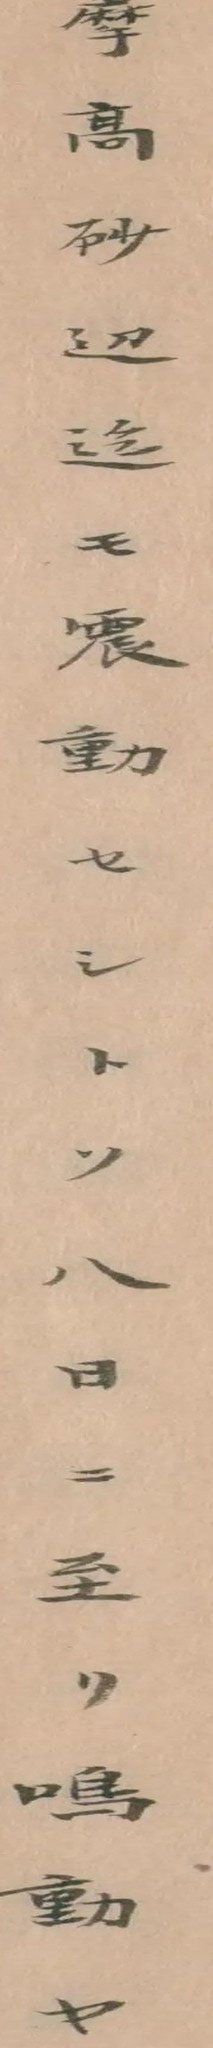磨高砂辺迄モ震動セシトソ八日二至り鳴動ヤ
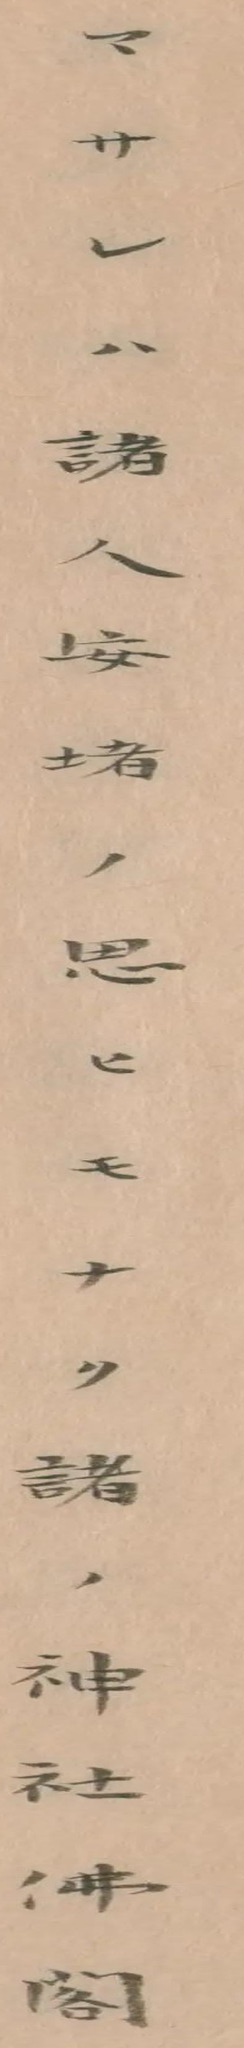マサレハ諸人安堵ノ思ヒモナク諸ノ神社仏閣
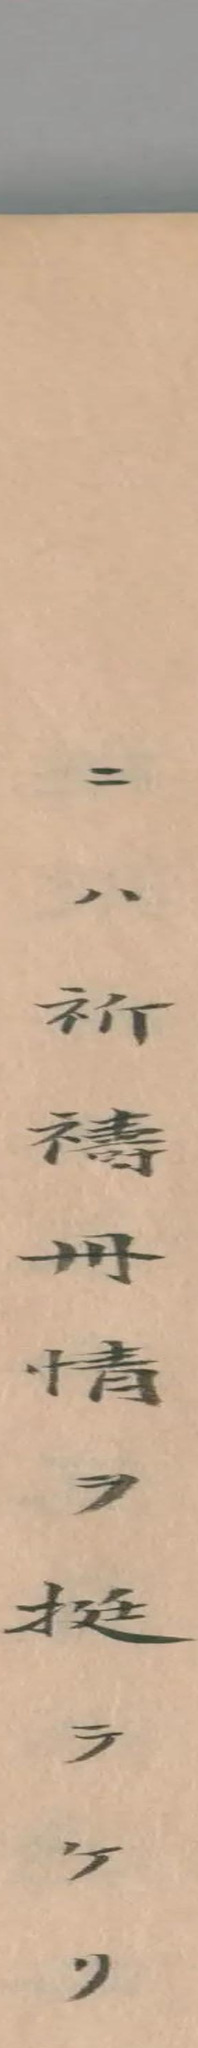ニハ祈祷丹情ヲ提挺テケリ

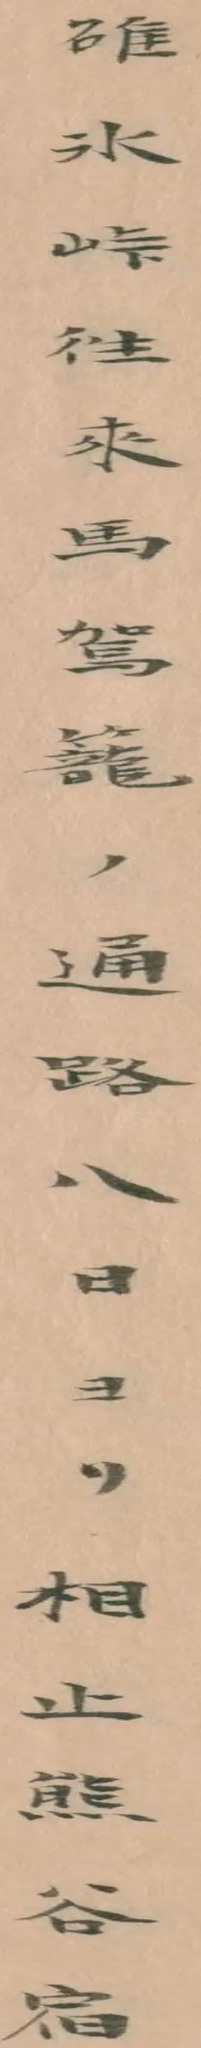碓氷峠往来馬駕籠ノ通路八日ヨリ相止熊谷宿
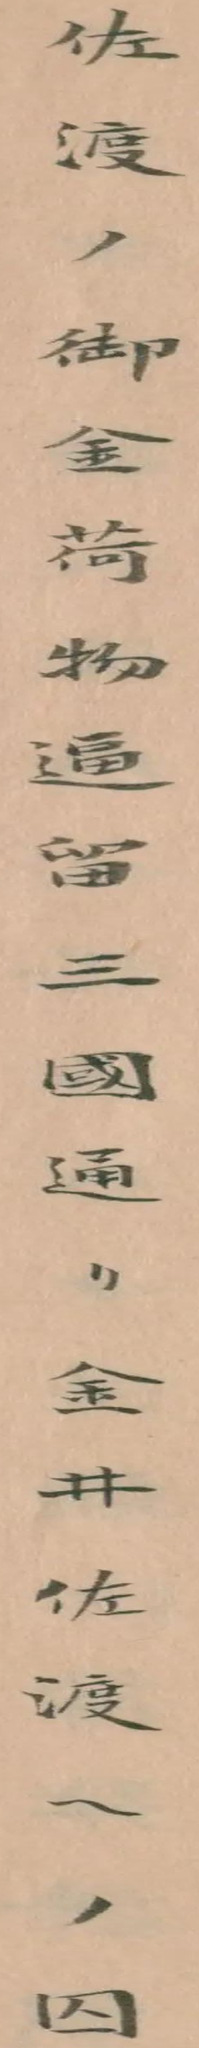佐渡ノ御金荷物逼留三国通り金井佐渡へノ囚
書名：地災撮要. 巻3(地震之部)-巻4(噴火之部)
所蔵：国立国会図書館 National Diet Library, JAPAN
